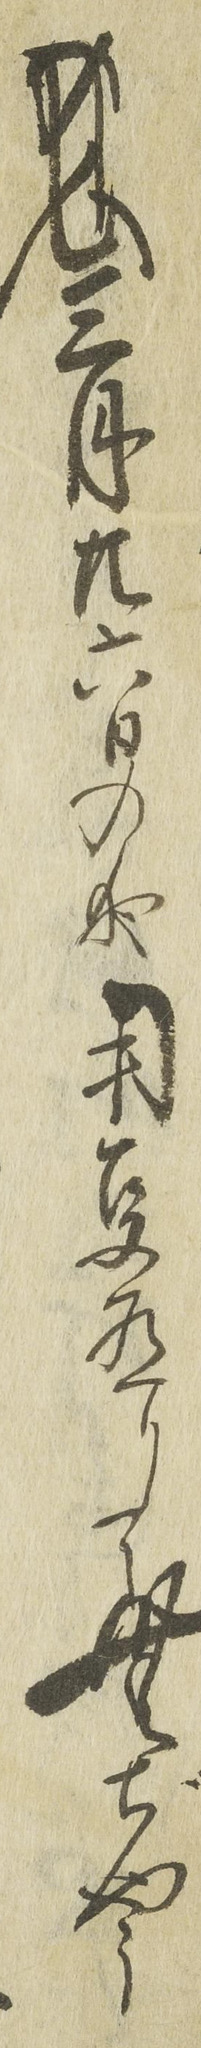三月廿六日の夜用事有りて無ぢやう
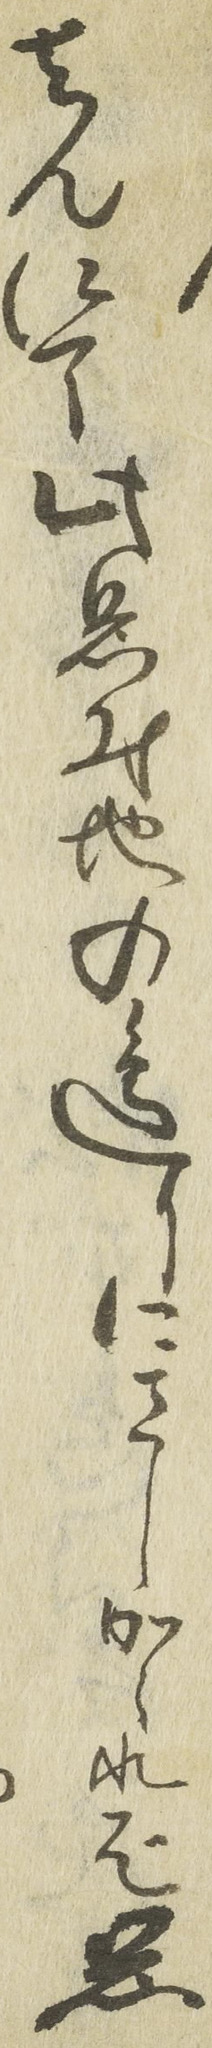ちんにて此えみ地の辺りにさしかゝればゑ
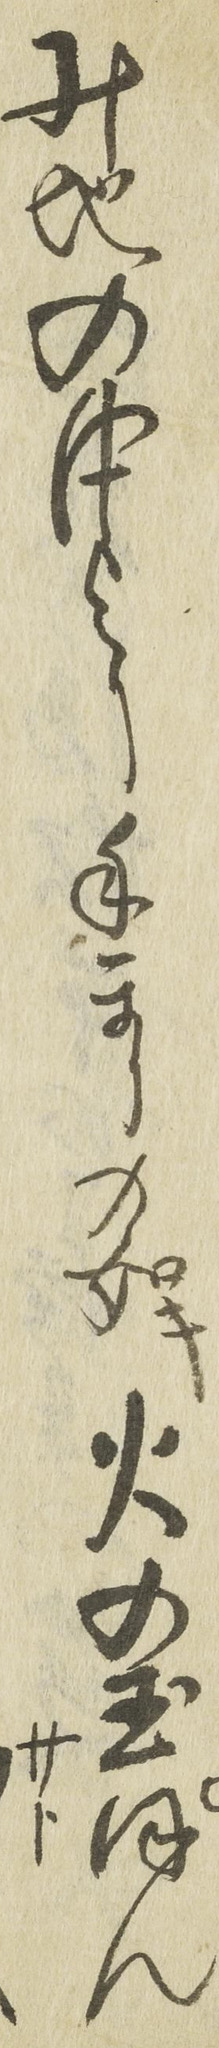み地の中より手まりの如キ火の玉ぽん
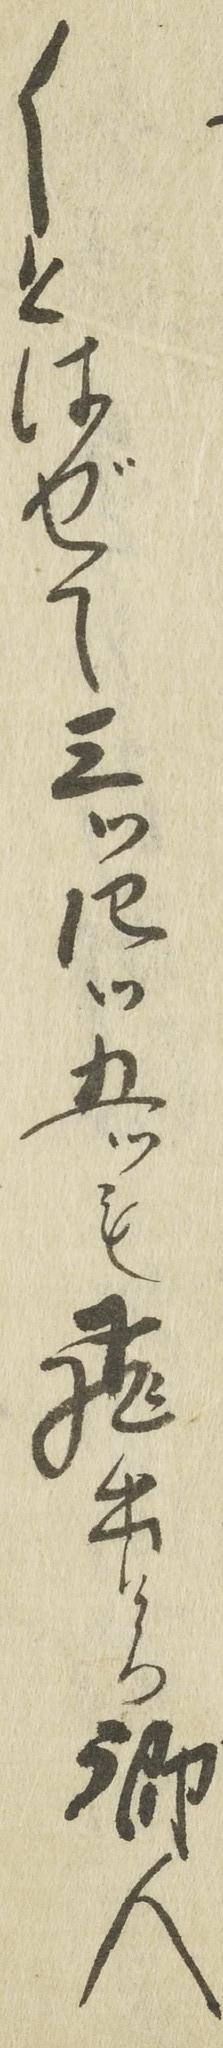〳〵とはぜて三ッ四ッ五ッも飛出しける郷人
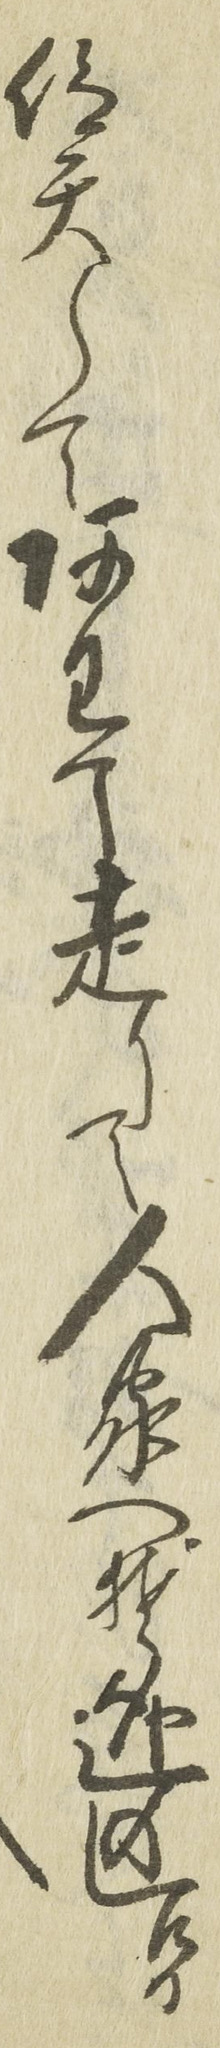仰天してあわて走りて人家へぞ逃込けり
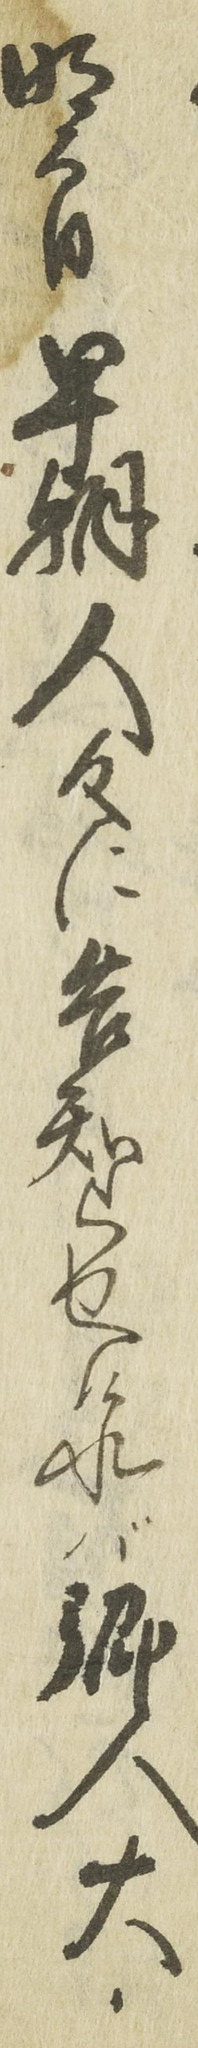明る日早朝人々に告知らせければ郷人大
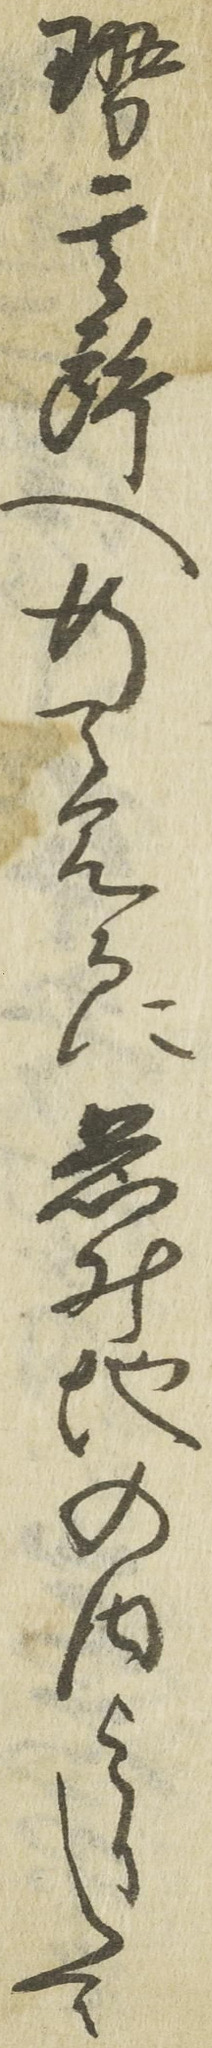勢其所へ行て見るにゑみ地の内よりして
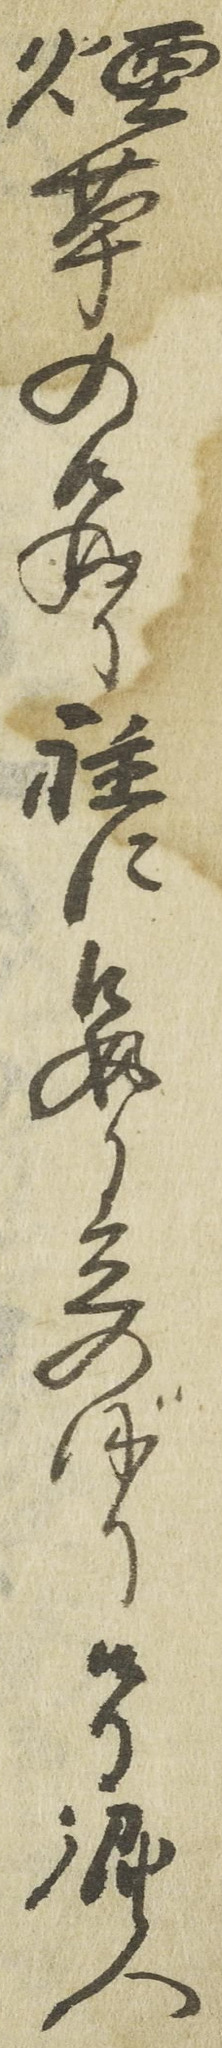煙草のけふり程にけふり立のぼりけり郷人
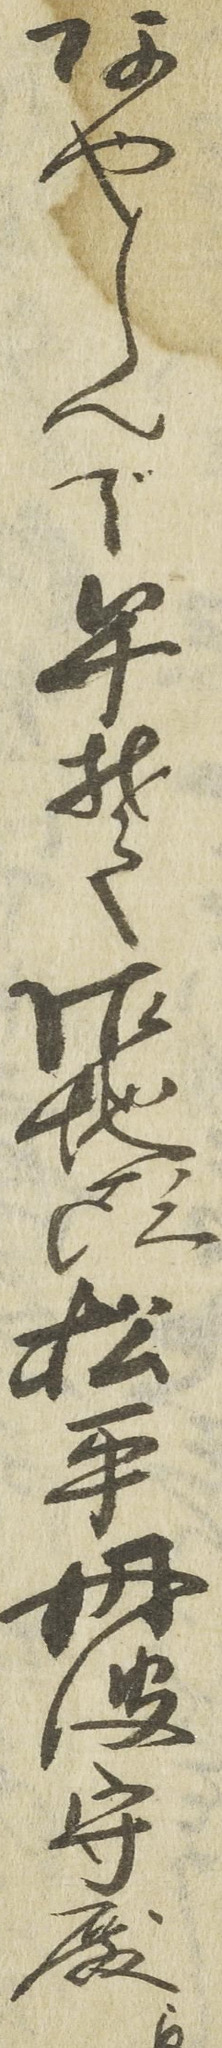あやしんで早そく御地頭松平丹後守殿え
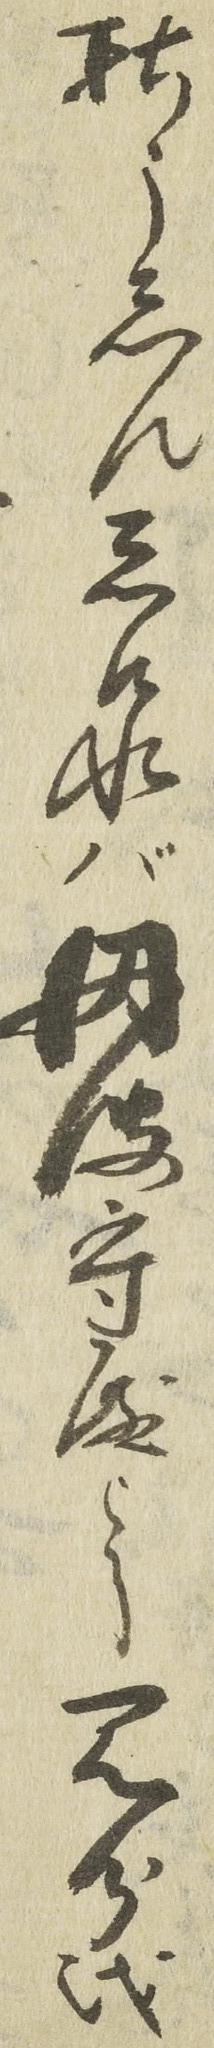ちうしんしければ丹後守殿より見分を
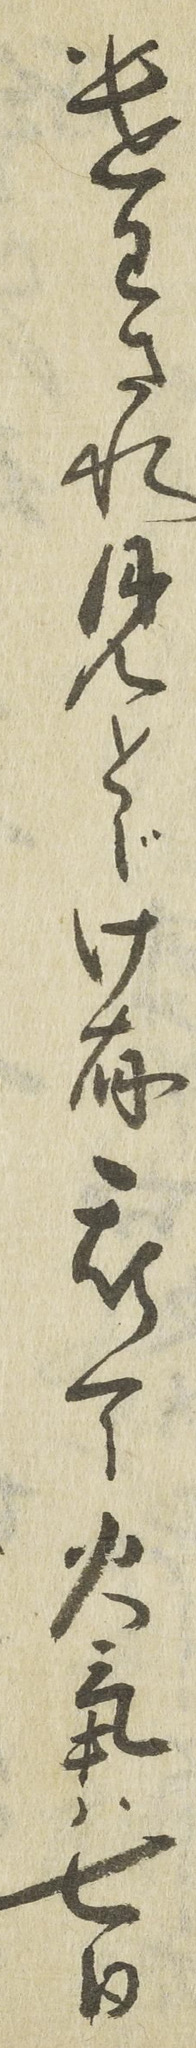遣わされ見とゞけ有斯て火気は七日
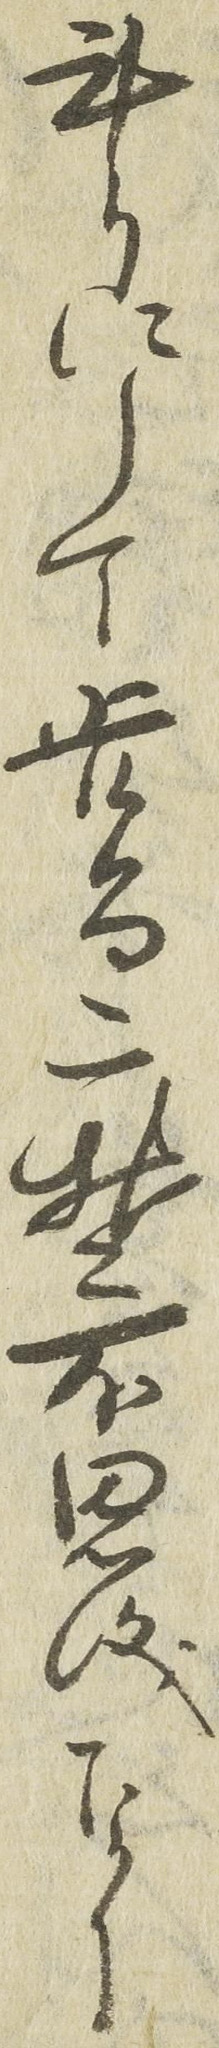計りして止けるこそ不思議なり
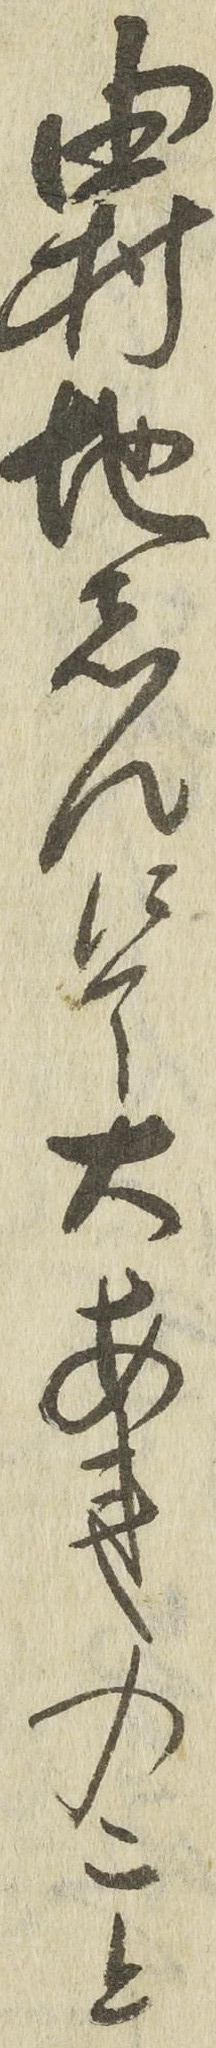由村地しんにて大あれのこと
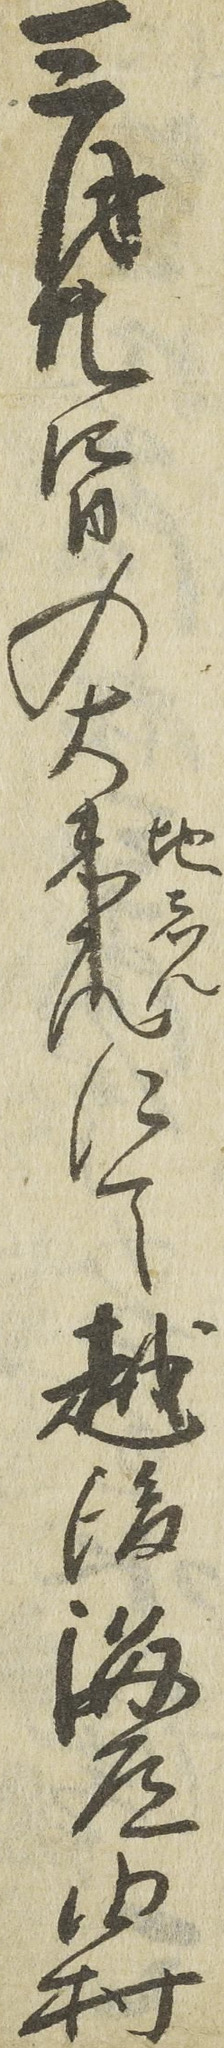三月廿四日の大地しんにて越後海道由村
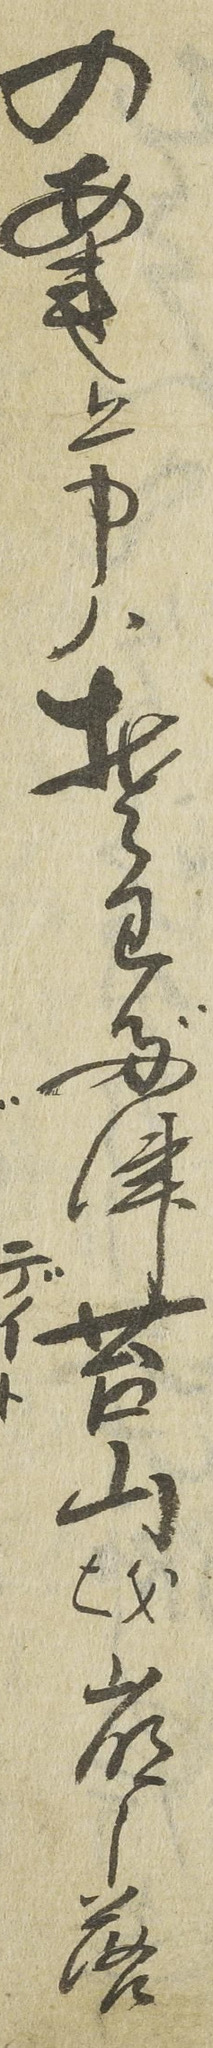のあれと申はそわだつ苔山を崩し落
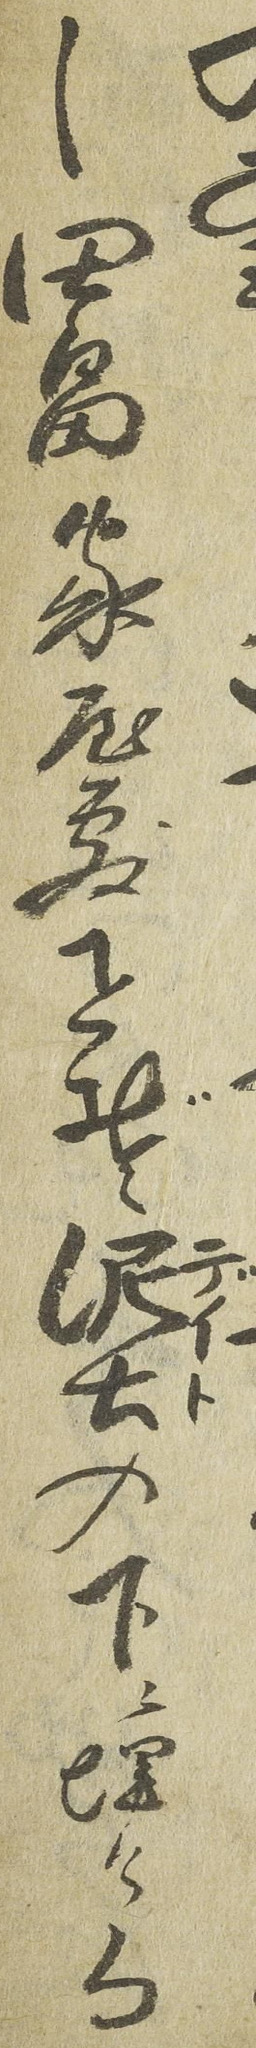し田畠家屋敷をぞ泥土の下に埋ける
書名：善光寺地震聞書
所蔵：東京大学地震研究所図書室 Earthquake Research Institute Library, The University of Tokyo, JAPAN
